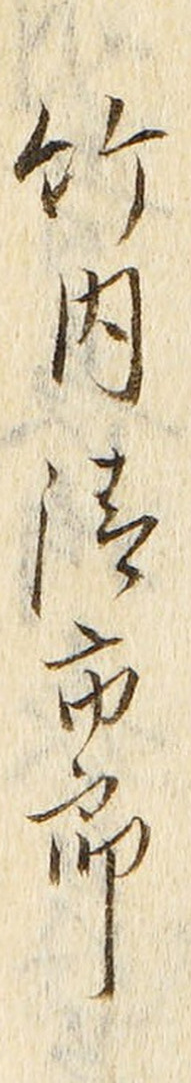竹内清市郎
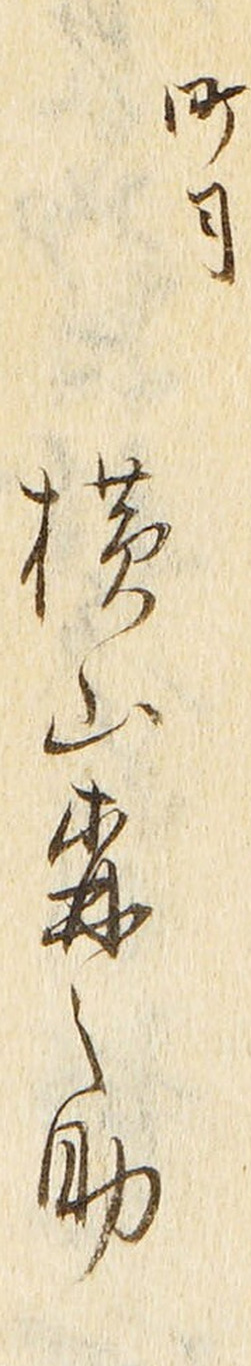横山森之助
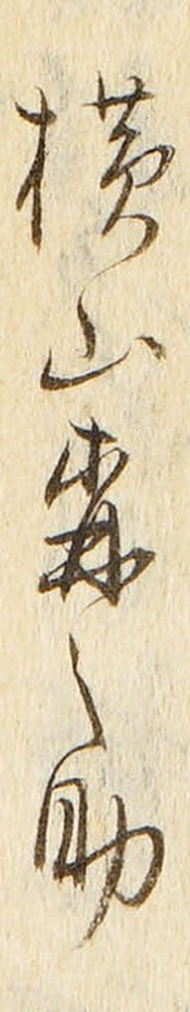横山森之助
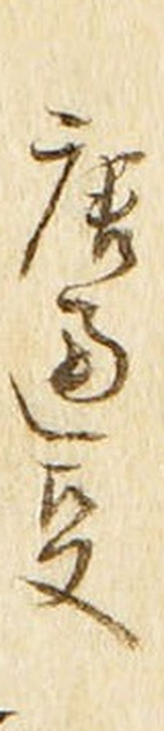唐通事
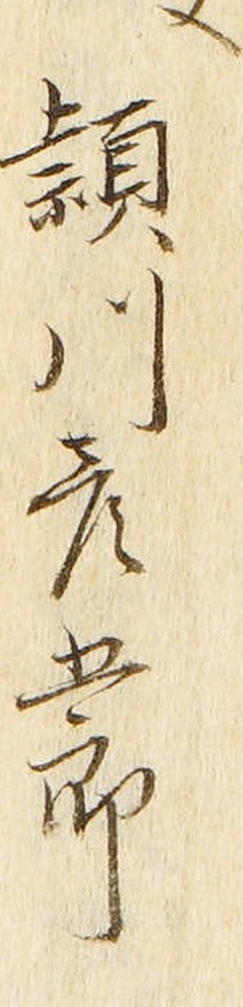頴川彦五郎
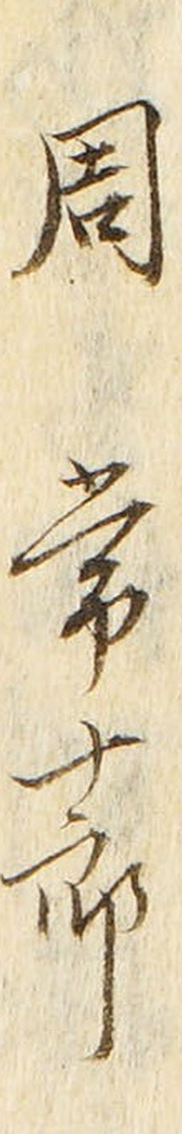周常十郎
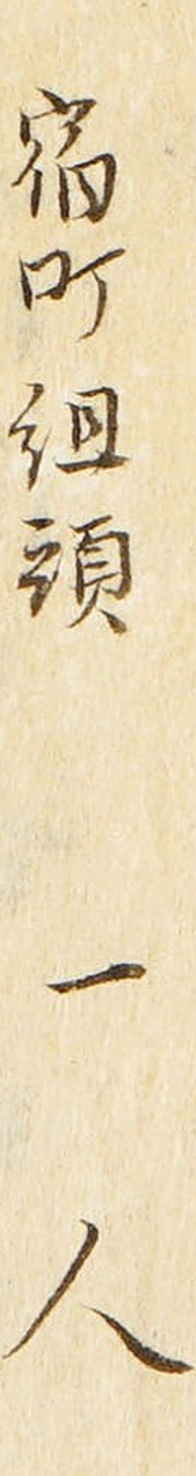宿町組頭一人
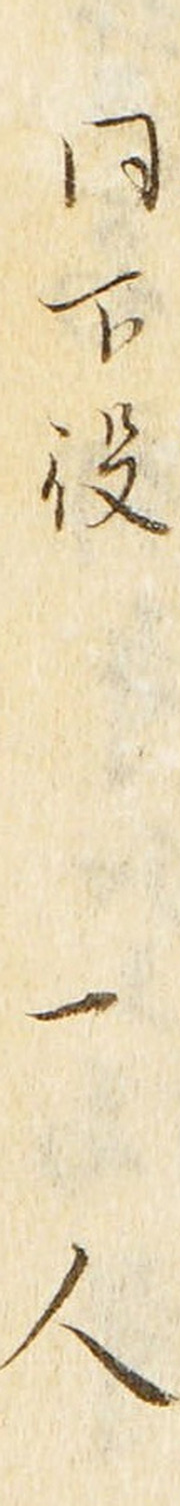同下役一人
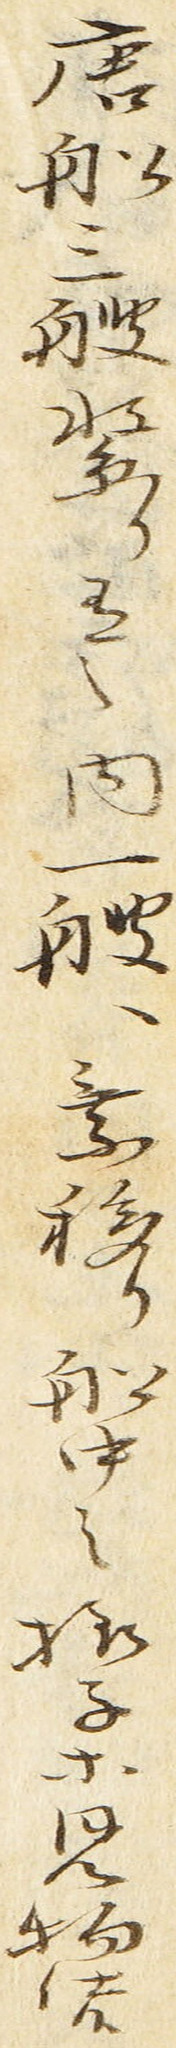唐船三艘緊り有之内一艘へ乗移り船中之様子等見物仕候
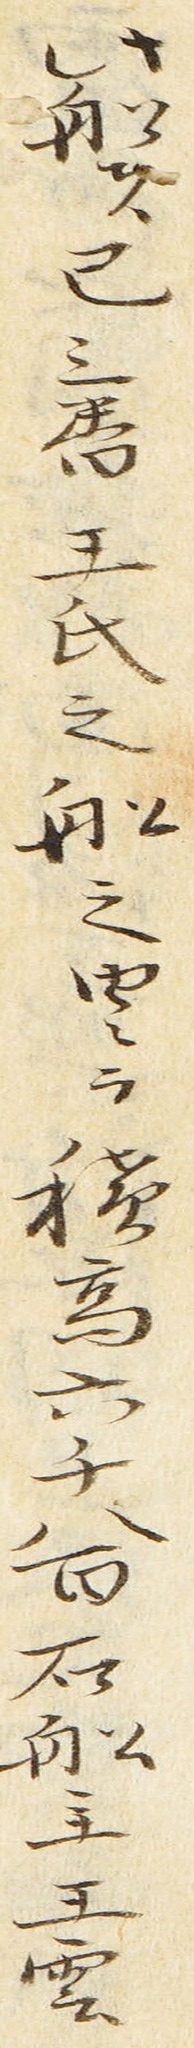此船は己三番王氏之船之由に而積高六千八百石船主王雲
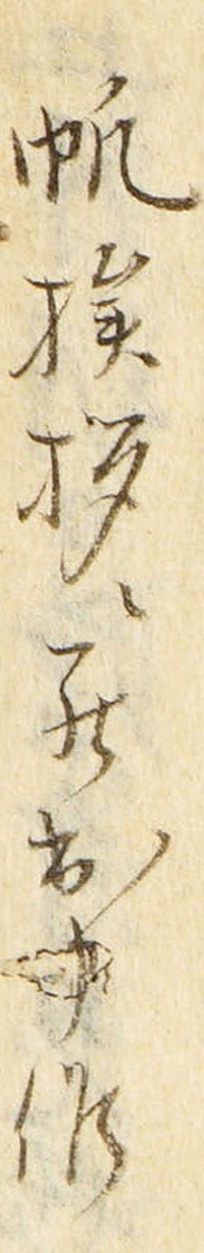帆挨拶に罷出申候

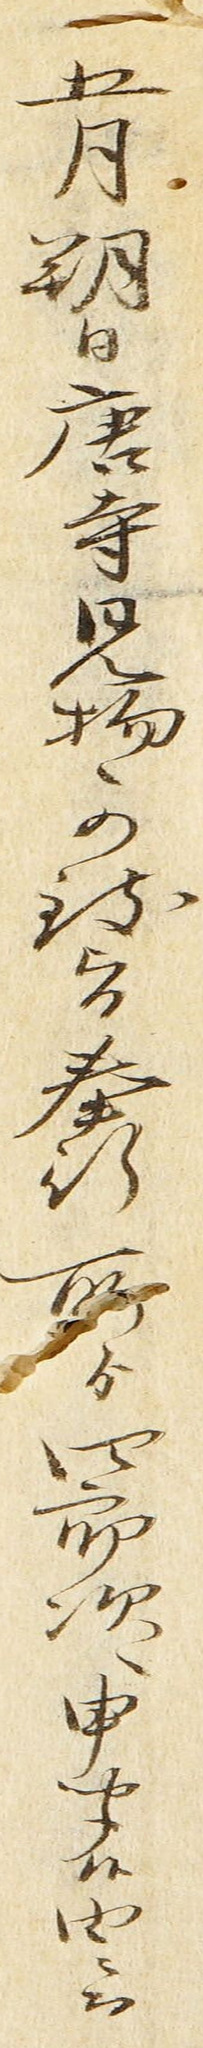五月朔日唐寺けん見致旨奉行所ゟ四郎次へ申聞候由に而
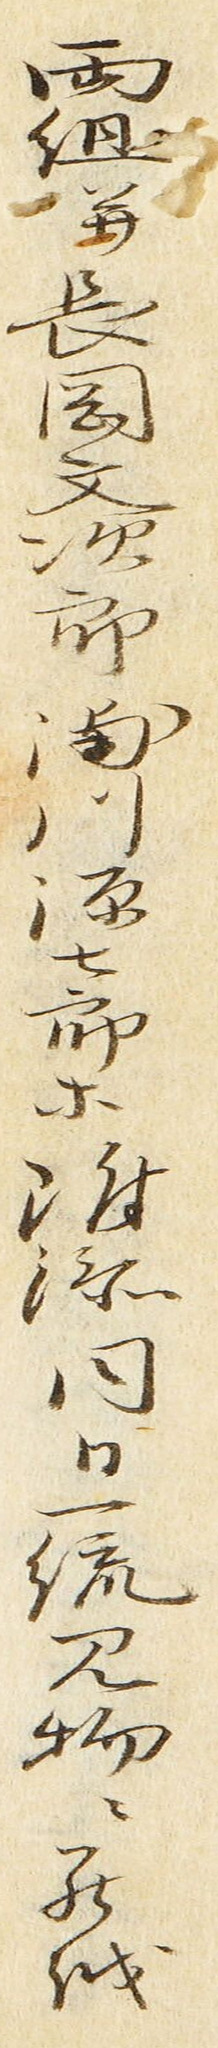両組並長岡文次郎浦川源七郎等附添同日一統見物に罷越
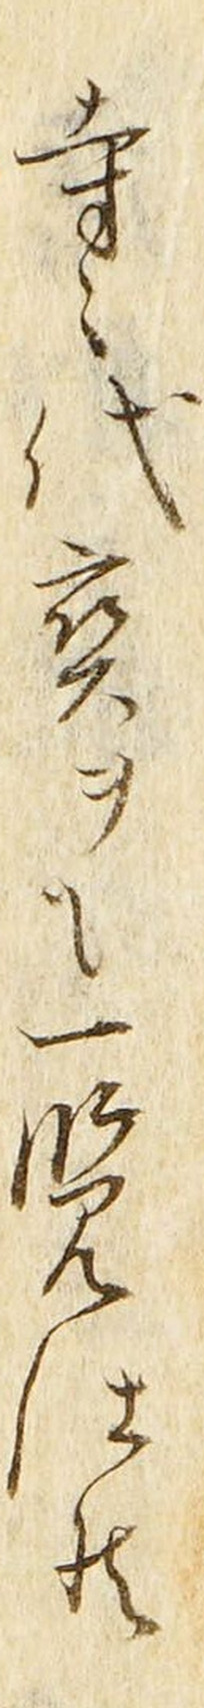寺寺代宝ヲも一覧仕候
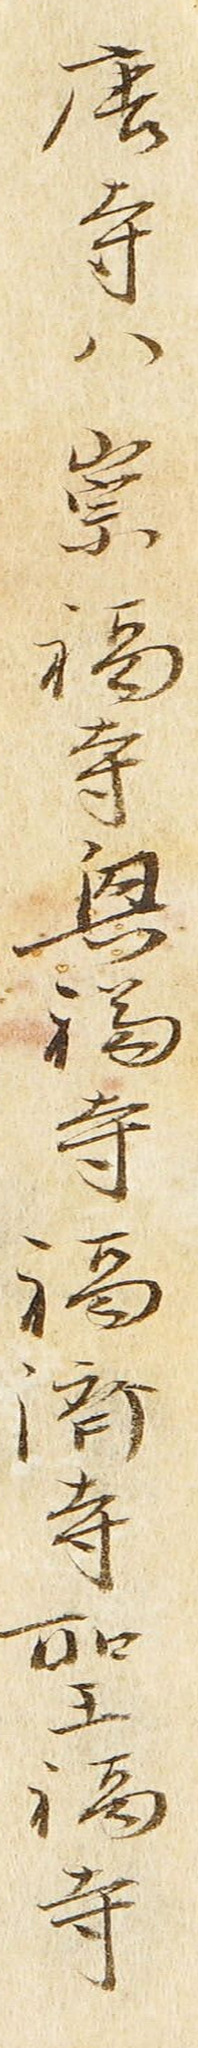唐寺は崇福寺興福寺福済寺聖福寺
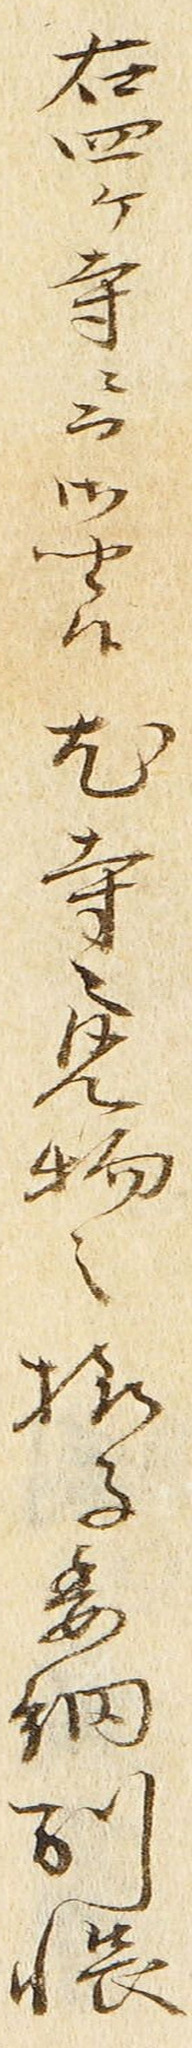右四ケ寺に而御座候尤寺寺見物之様子委細別帳
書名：長崎漂流記
